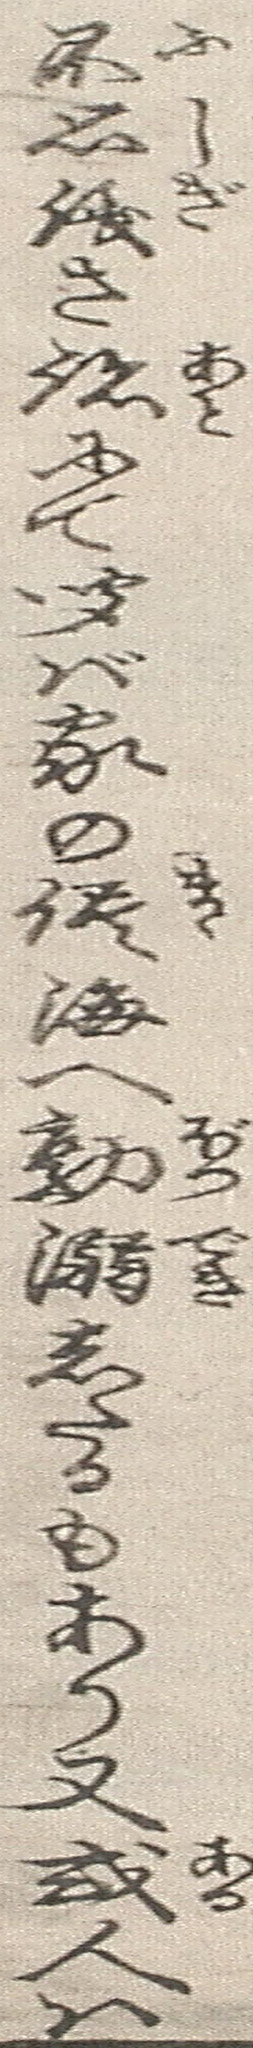不思議さ後にて聞バ家の儘海へ動溺したるもあり又或人ハ
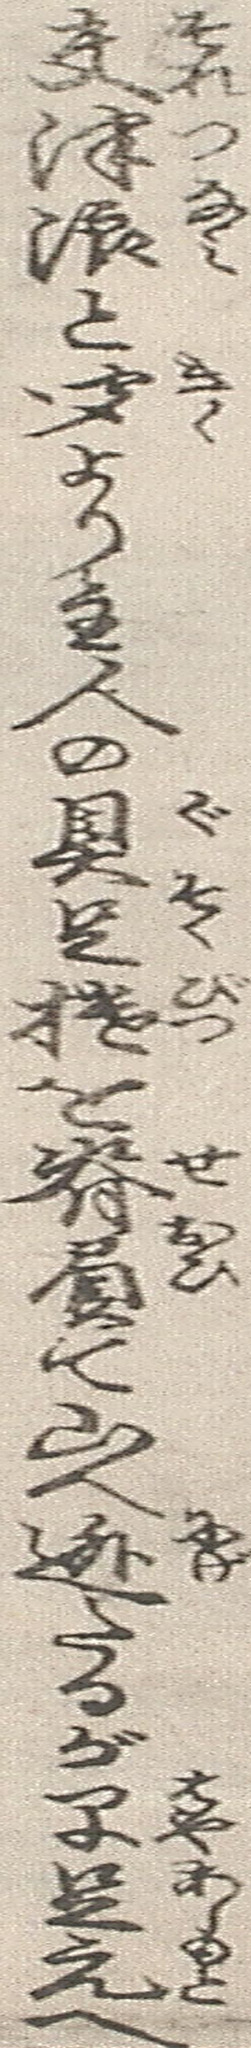夫津浪と聞より主人の具足櫃を背負て山へ逃たるが早足元へ
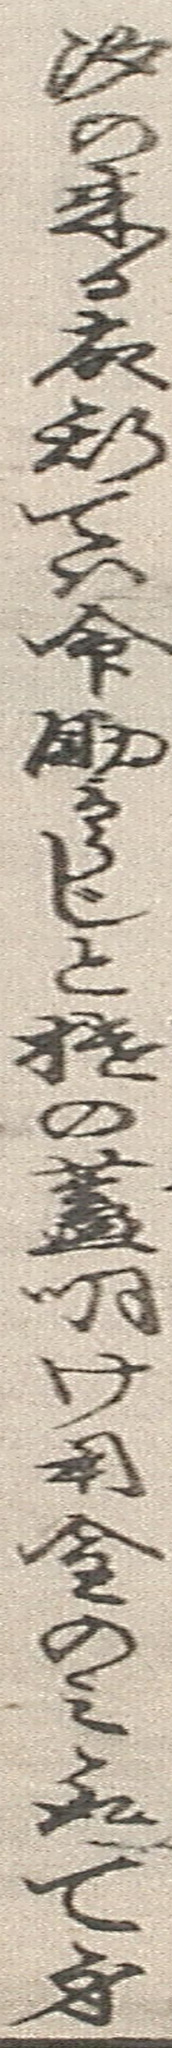汐の来る故斯てハ命助からじと櫃の蓋明け用金のミ取出て身
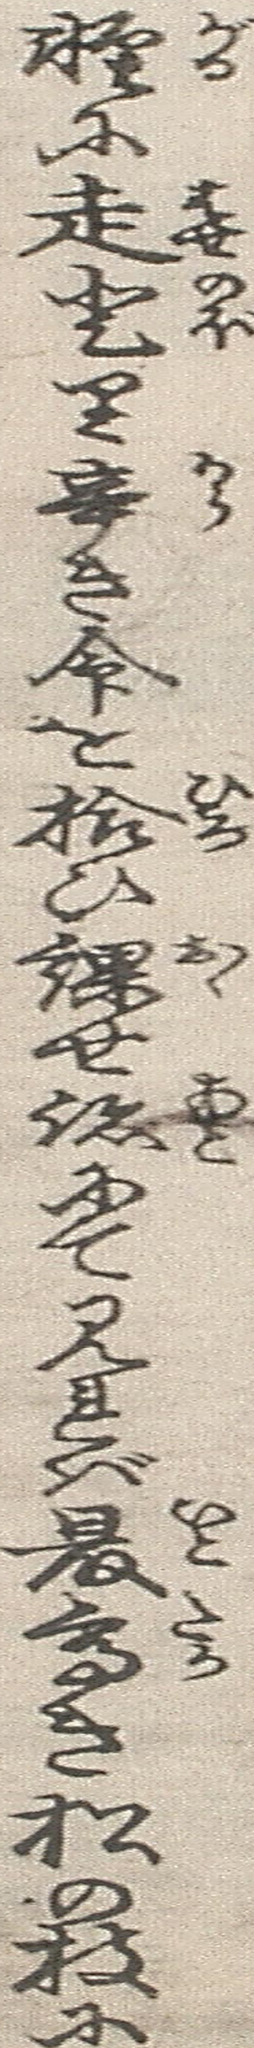輕に走登り辛き命を拾ひ課せ後にて見れバ最高き松の枝に
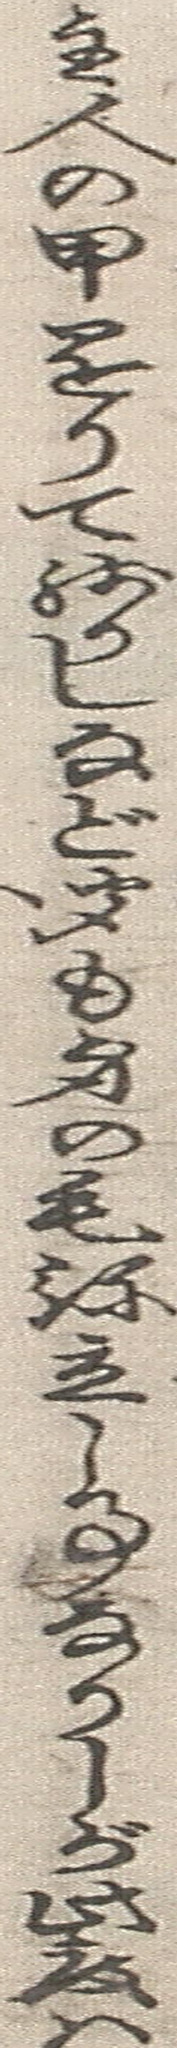主人の冑懸りて残りしなど聞も身の毛弥立し事なりしが此度ハ
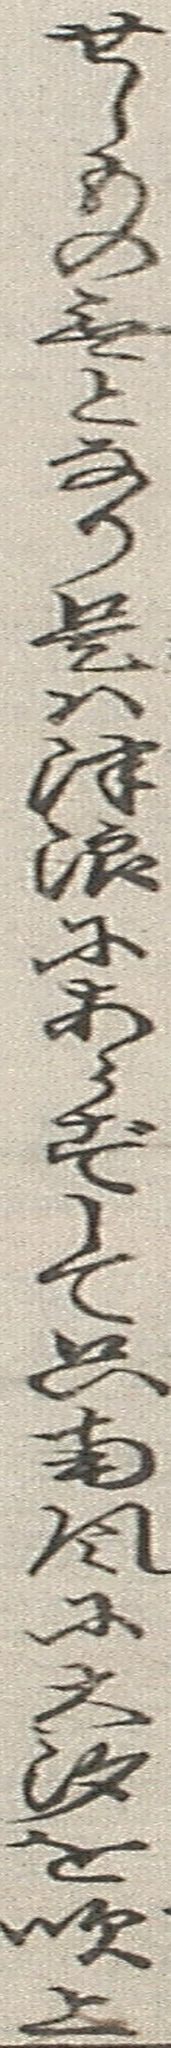せしもの無となり是ハ津浪にあらずして只南風に大汐を吹上
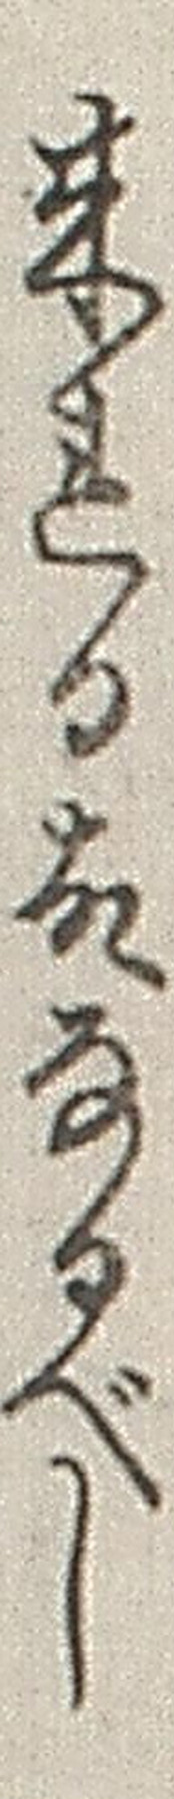来れる故なるべし
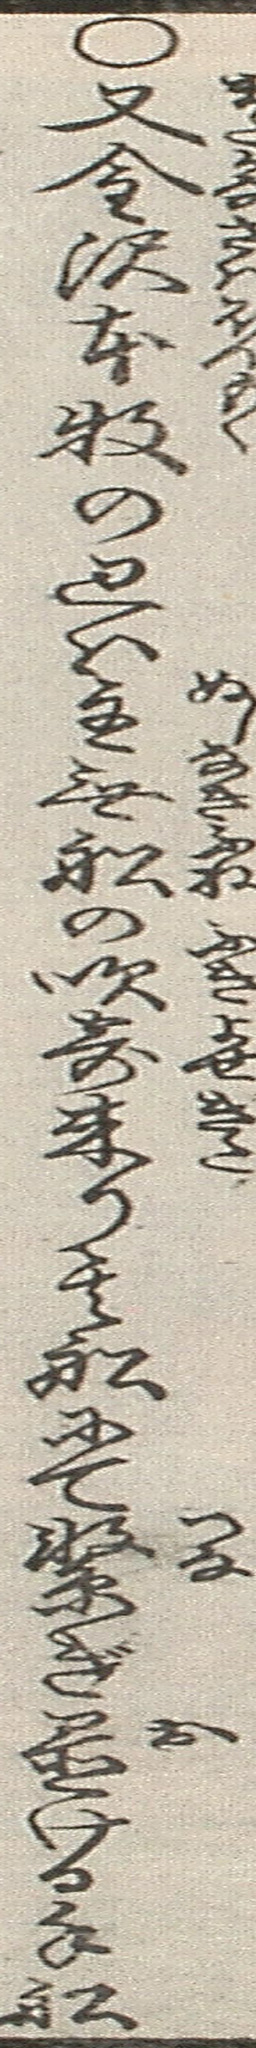◯又金沢本牧の辺ハ主無船の吹寄来り其船にて繋ぎ置ける手船
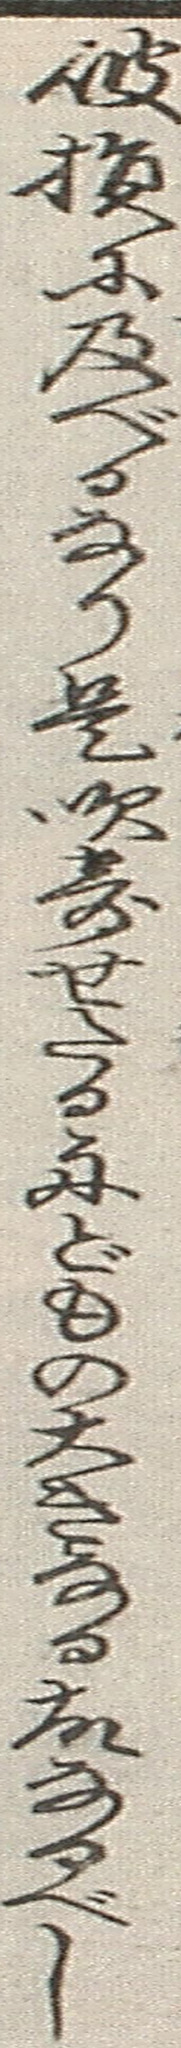破損に及べるなり是吹寄せたる舟どもの大きなる故なるべし
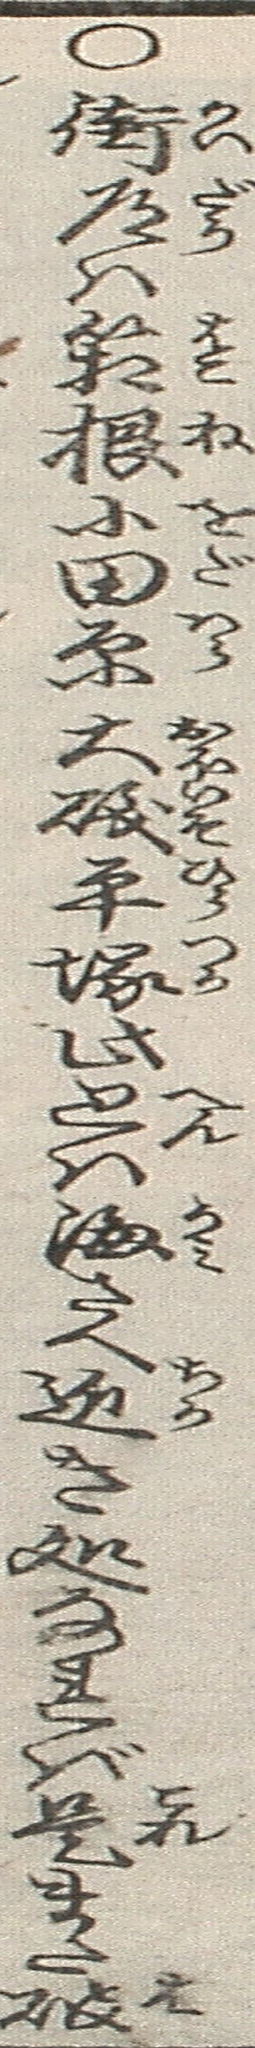◯海道ハ箱根小田原大磯平塚此辺ハ海さへ近き処なれバ是また破
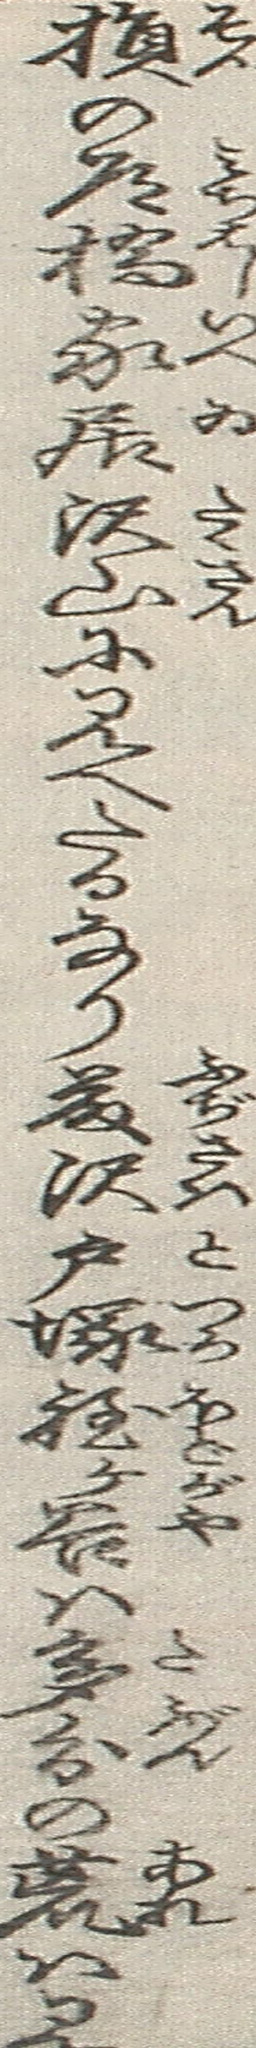損の道橋家居沢山に見へたるなり藤澤戸塚保土ヶ谷ハ多分の荒ハ見
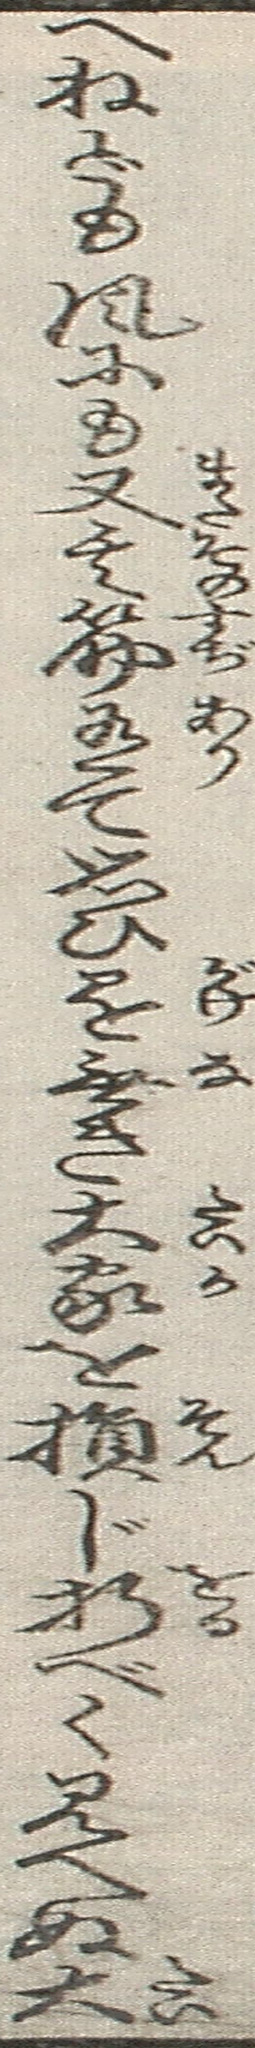へねども風にも又其筋有て思ひ懸無き大家を損じ折べく見へぬ大
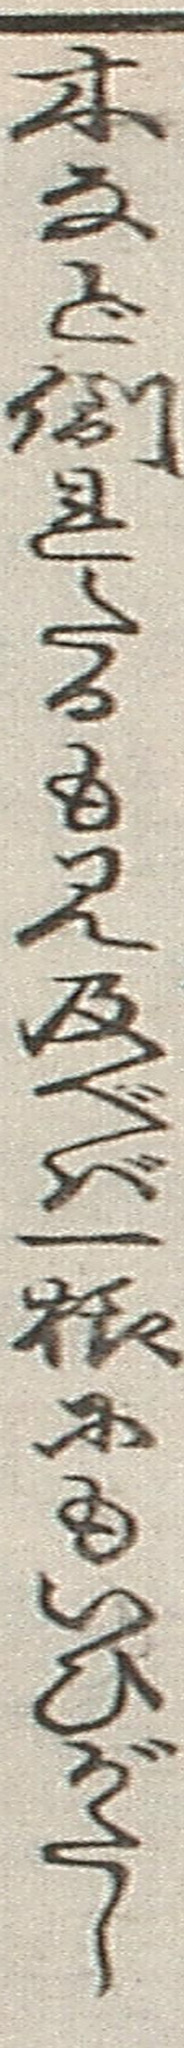木など倒れたるも見及べバ一様にもいひがたし
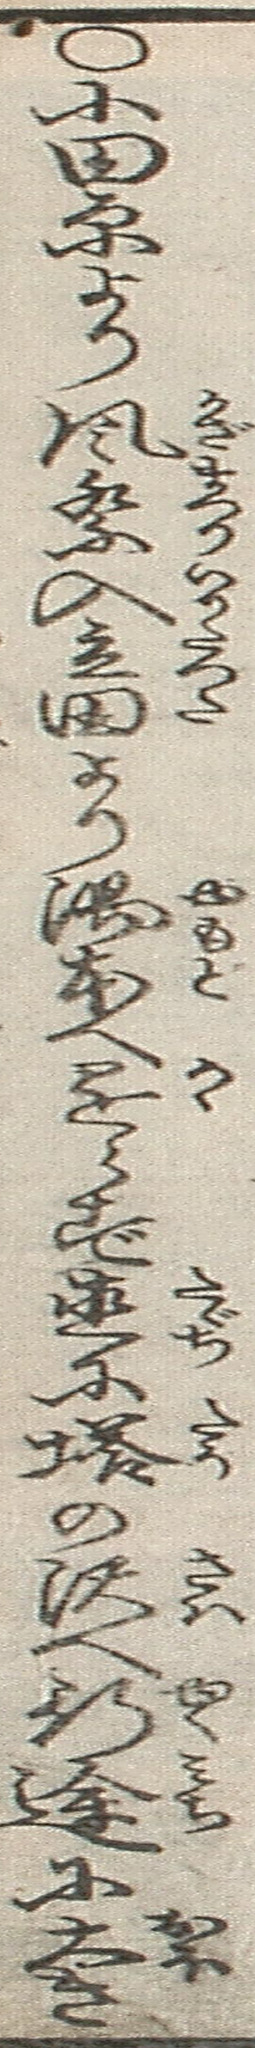◯小田原より風祭入立田より湯本へ懸らず直に塔の沢へ行途に大き
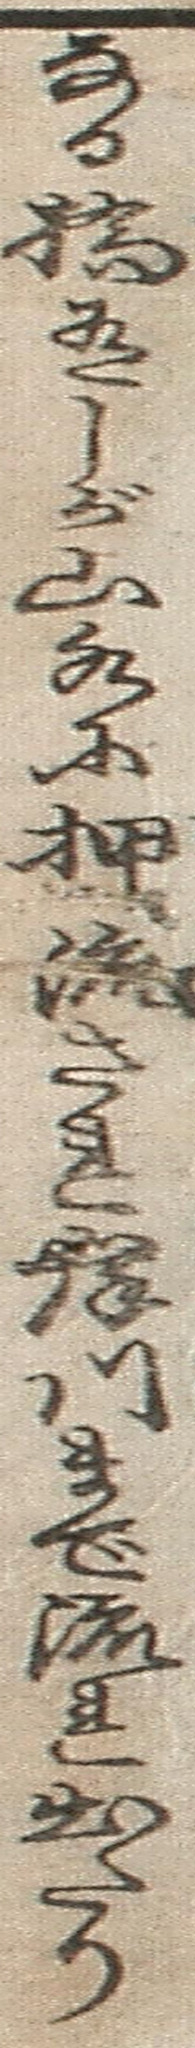なる橋有しが山水に押流され岸川まで流れ出たり

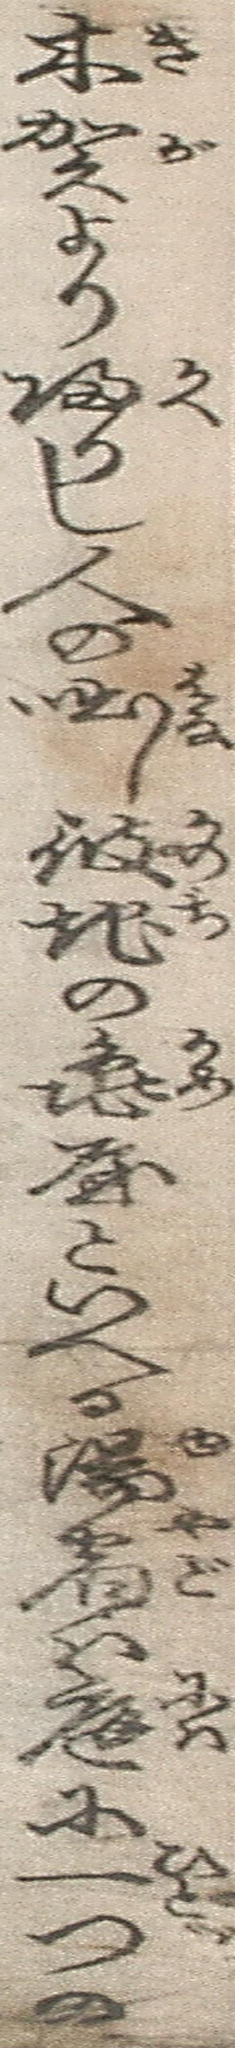木賀より帰りし人の咄し彼地の龜屋といへる湯宿ハ庭に一つの
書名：安政風聞集　上中下　全
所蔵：東京大学地震研究所図書室 Earthquake Research Institute Library, The University of Tokyo, JAPAN
